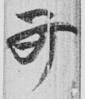可
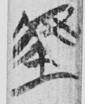○（吾）
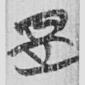是
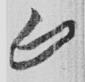㠯（以）
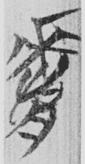○（瘠）
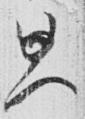也
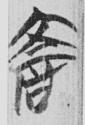○（顔）
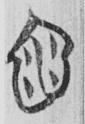淵
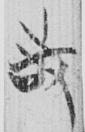○（侍）
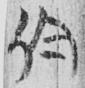於
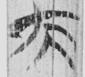夫夫
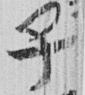夫子
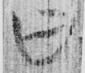曰
